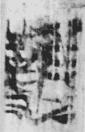灘（漢）
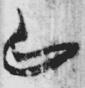㠯（以）
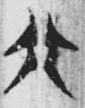北
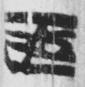爲
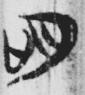名
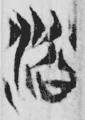浴（谷）
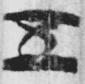五
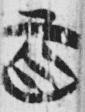百
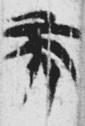天
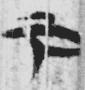下
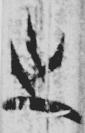之
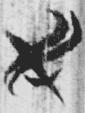民
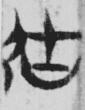居
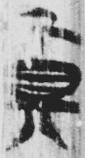奠
